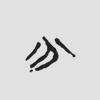分
